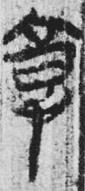○（敦）
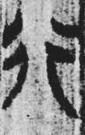行
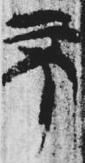不
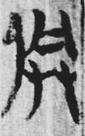○（倦）
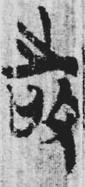○（持）
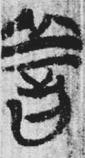善
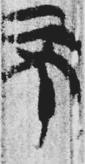不
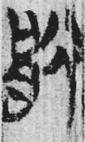猒（厭）
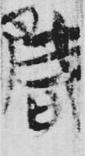唯（雖）
